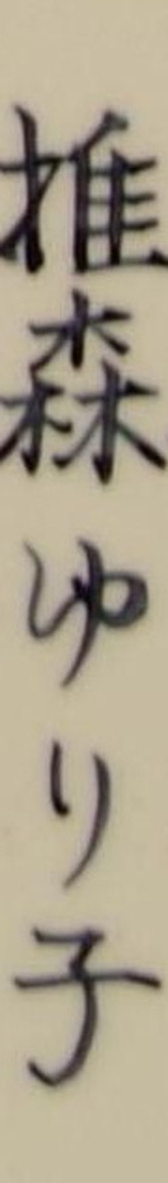椎森ゆり子
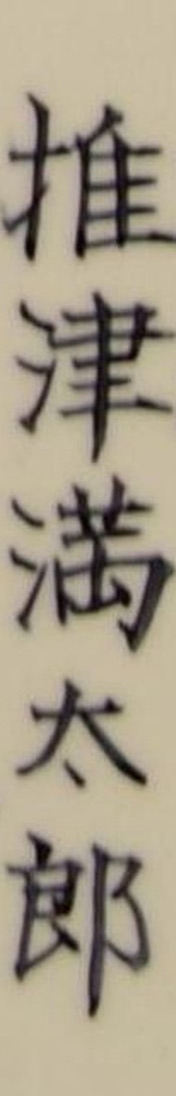椎津満太郎
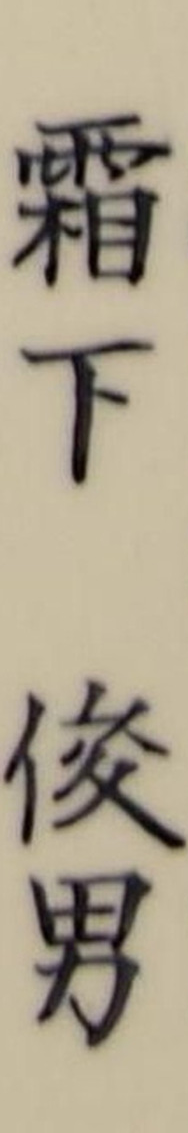霜下俊男
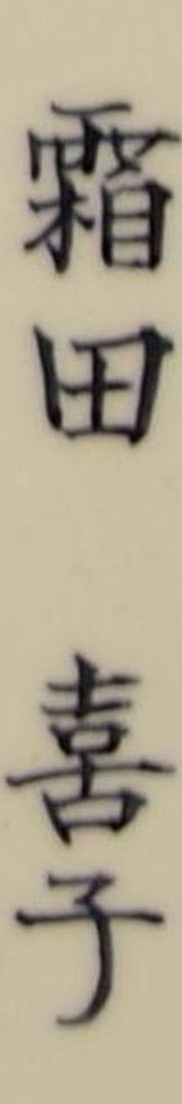霜田喜子
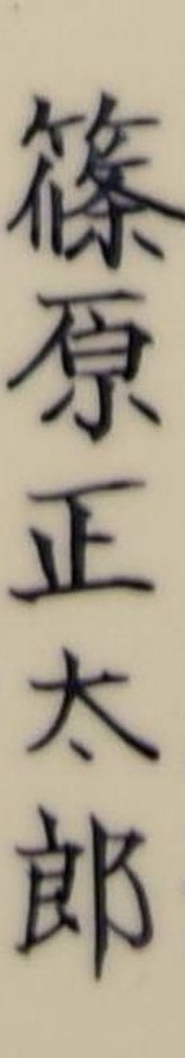篠原正太郎
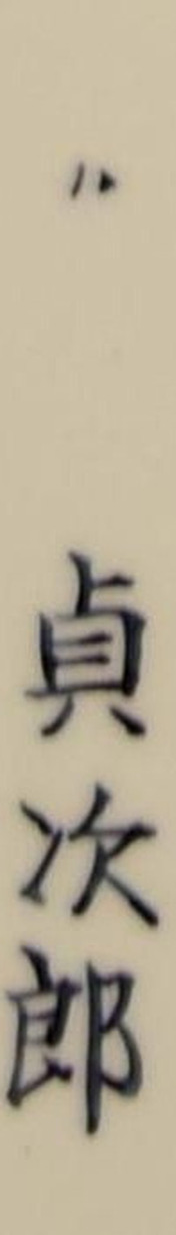貞次郎
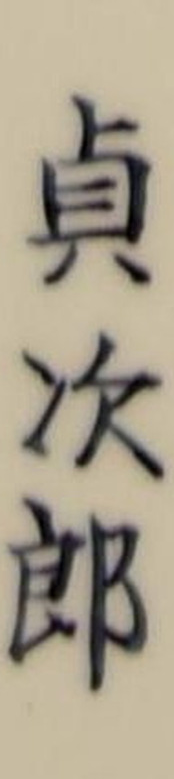貞次郎
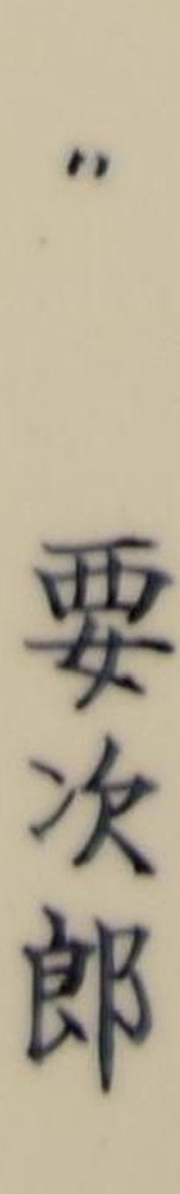要次郎
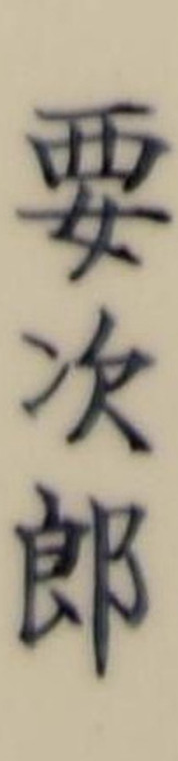要次郎
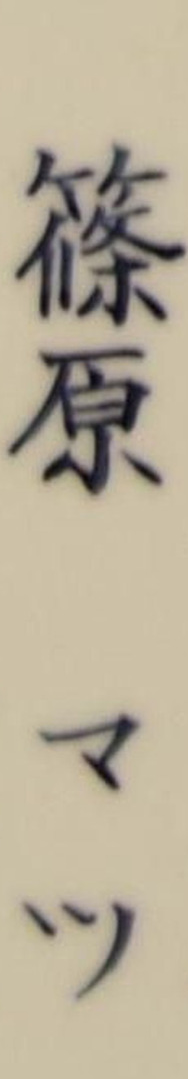篠原マツ
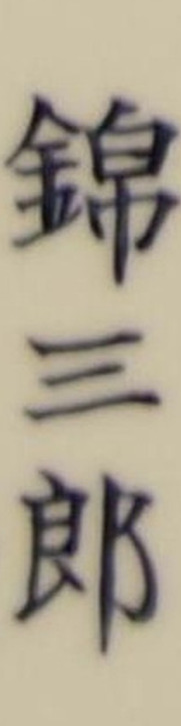錦三郎
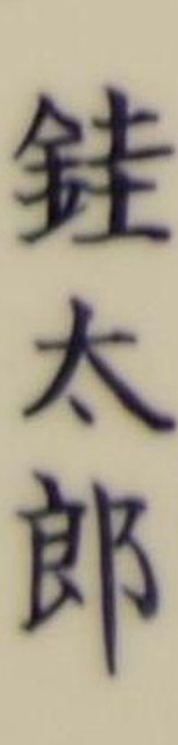銈太郎
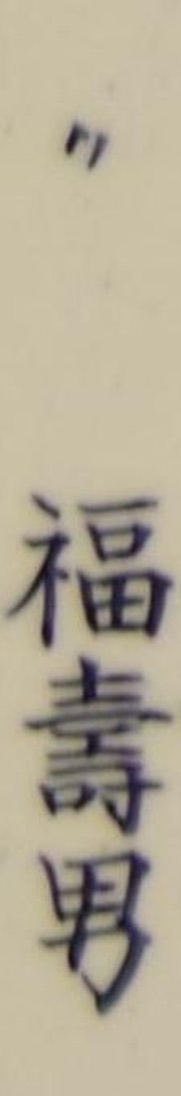福壽男
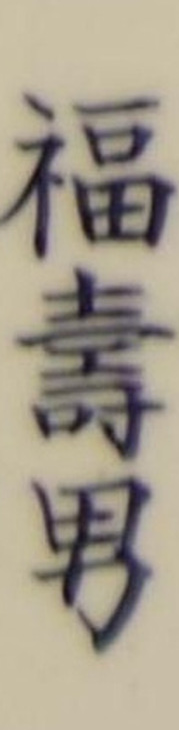福壽男

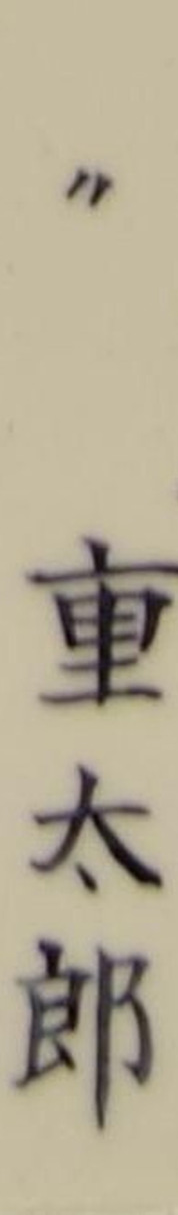重太郎
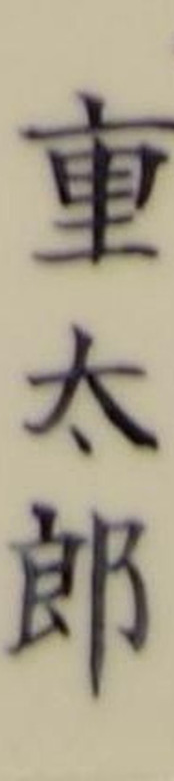重太郎
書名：A~D
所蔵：koyasan kongobuji
